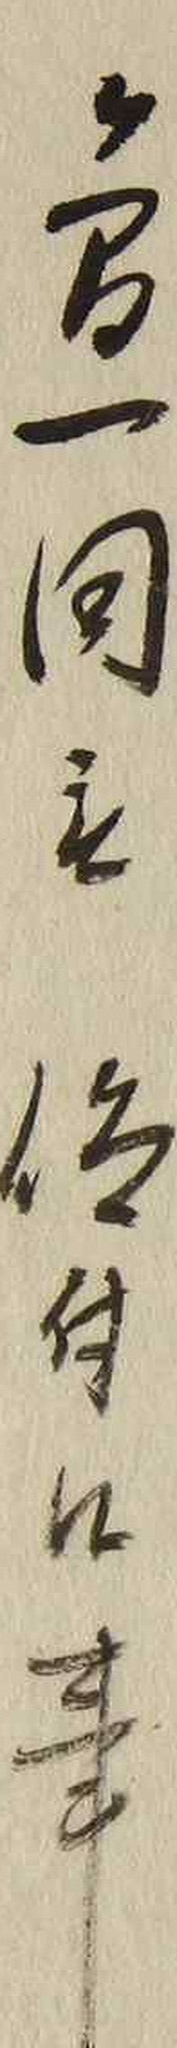ケ間一同被仰付候事
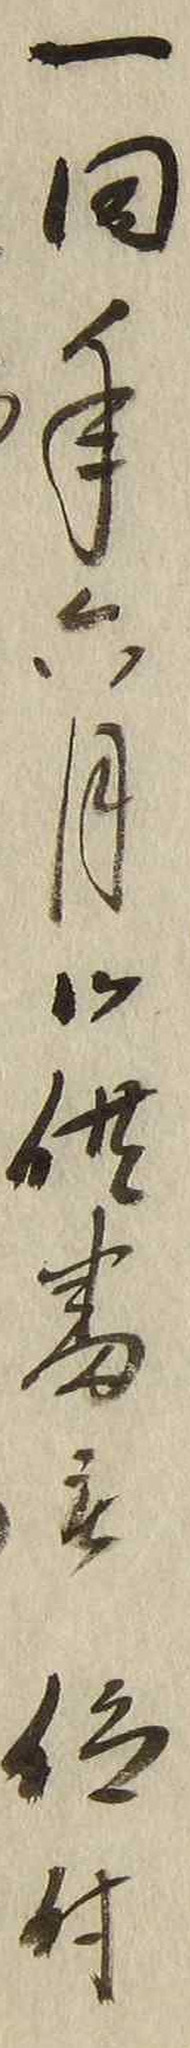一同年六月御供番被仰付
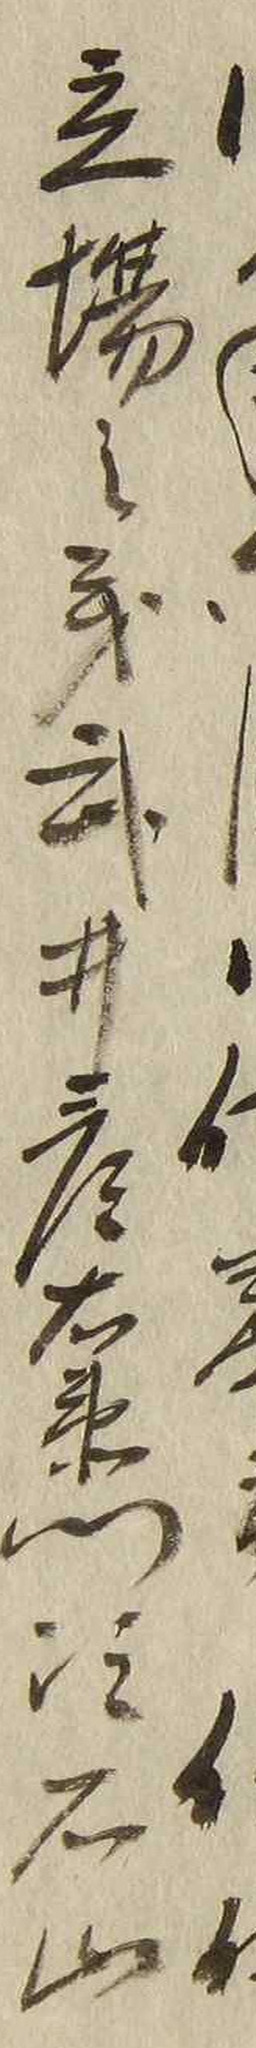立場之義武井彦右衛門次石山

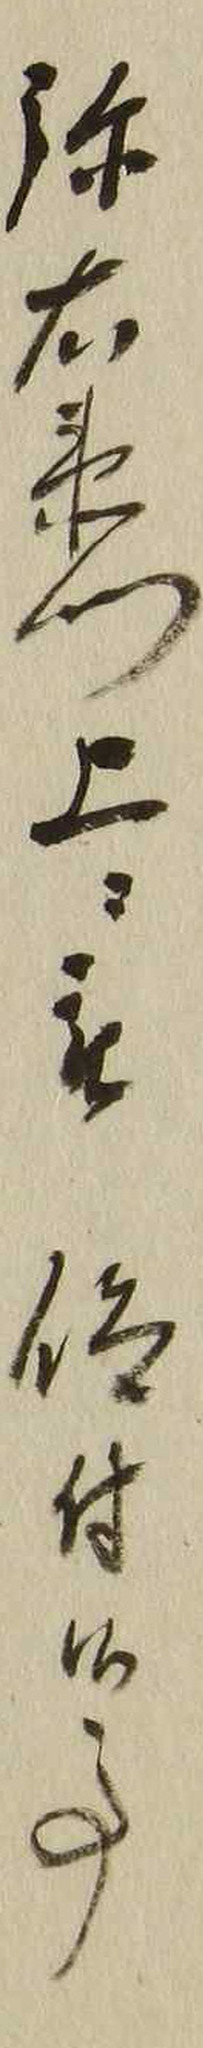弥右衛門上ニ被仰付候事
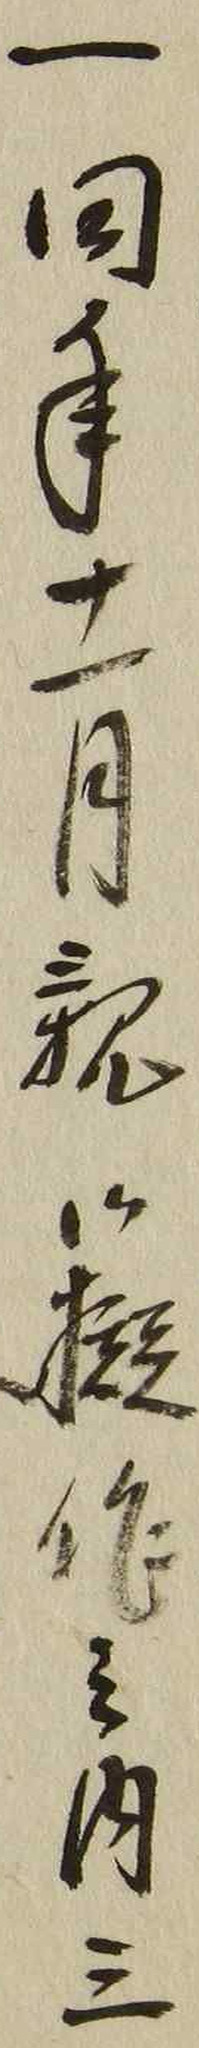一同年十一月親御擬作之内三
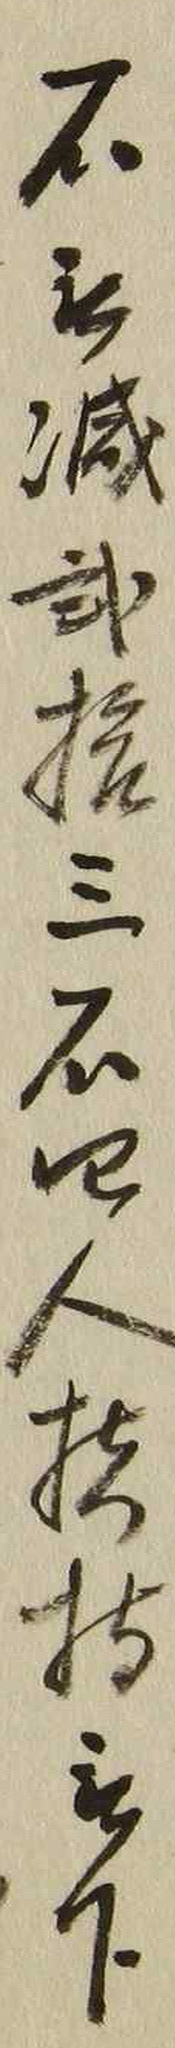石被減弐拾三石四人扶持被下
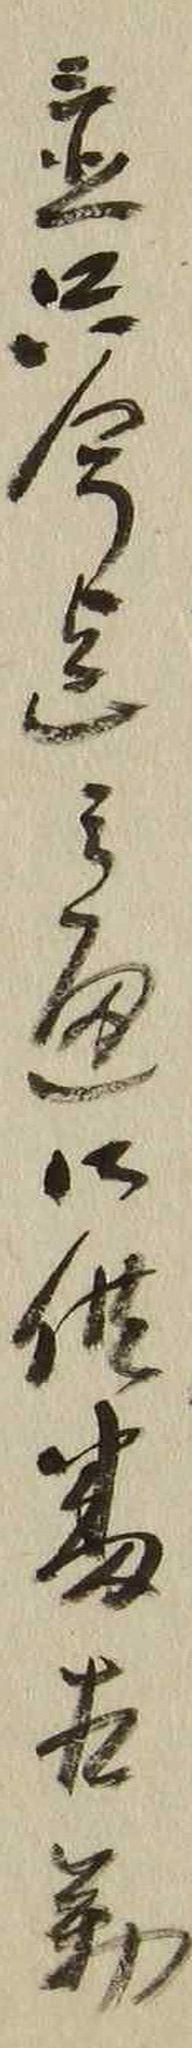置只今迄之通御供番相勤
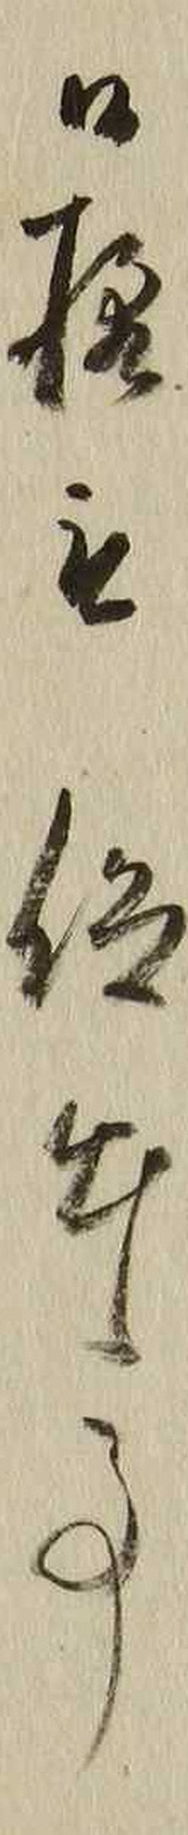候様被仰出候事
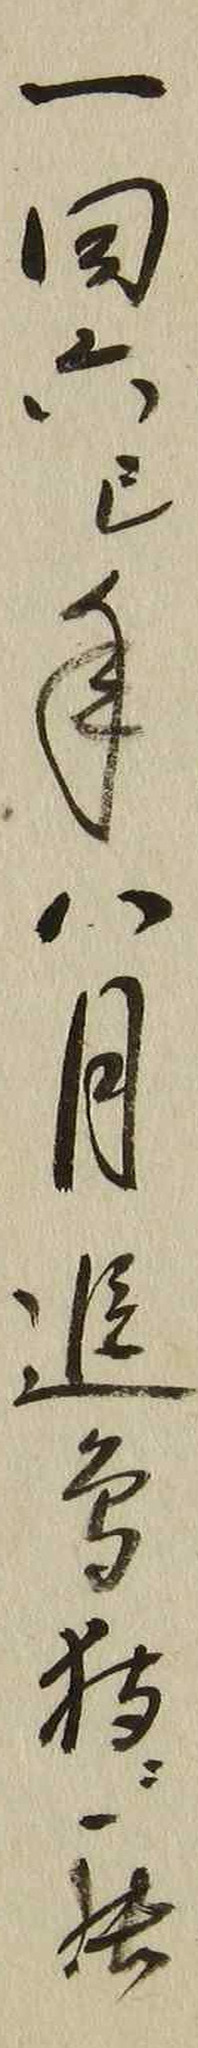一同六巳年八月追鳥狩ニ罷
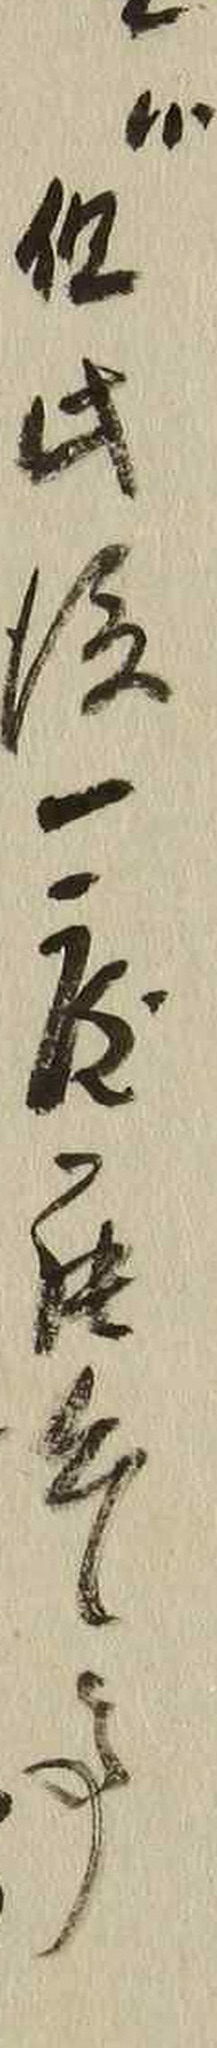但此後一度罷出候事
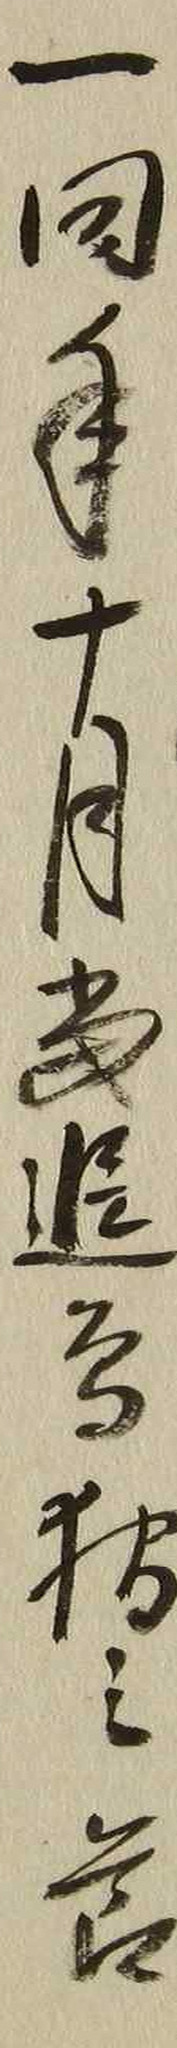一同年十月当追鳥狩之節
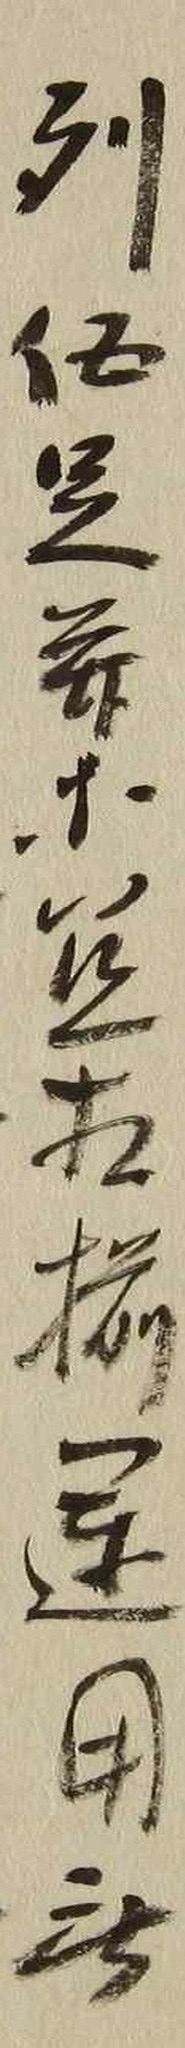列伍足並等宜相揃運用無
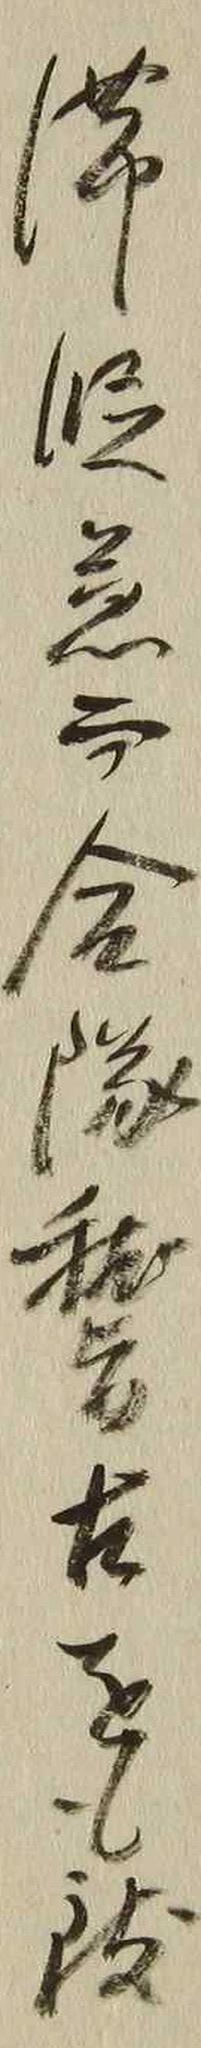滞段兼而合隊稽古をも致
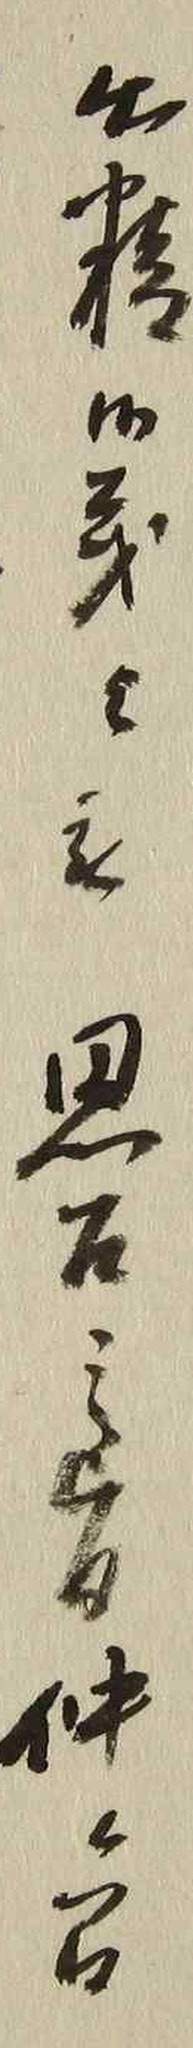出精候義与被思召之旨仲ケ間
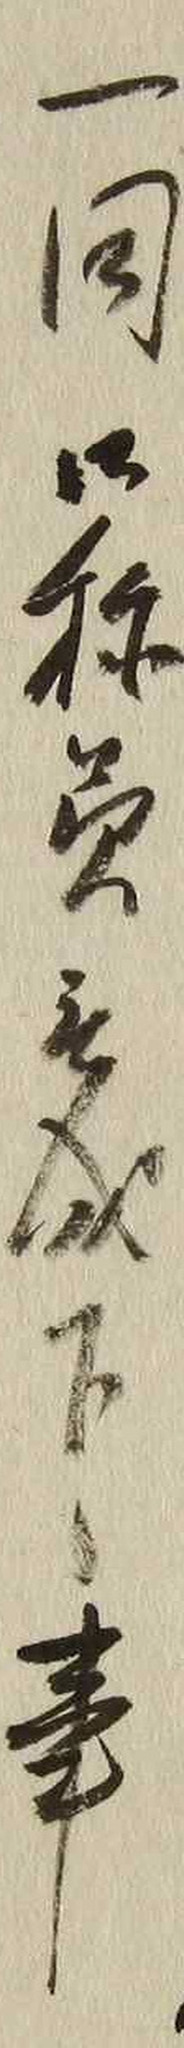一同御称美被成下候事
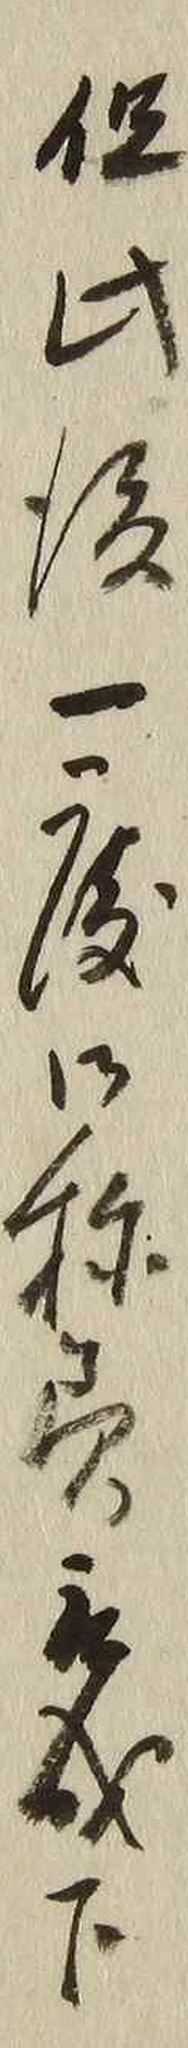但此後一度御称美被成下
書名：諸士系譜　巻之359　す之部9
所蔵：会津若松市立会津図書館
